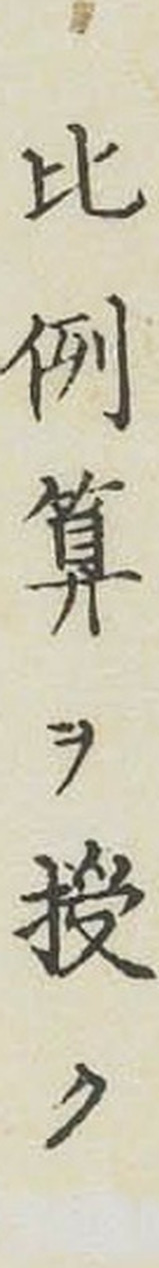比例算ヲ授ク
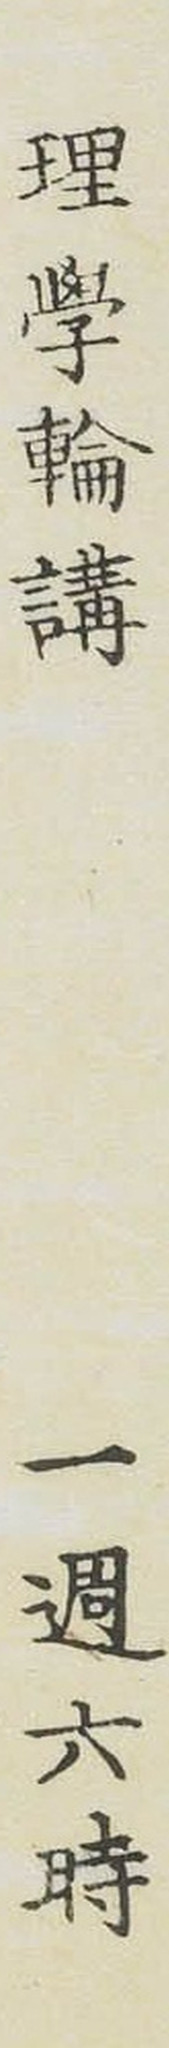理学輪講一週六時
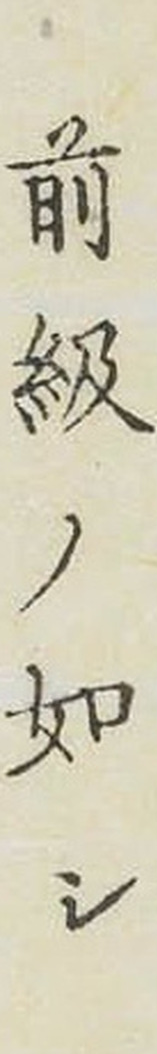前級ノ如シ
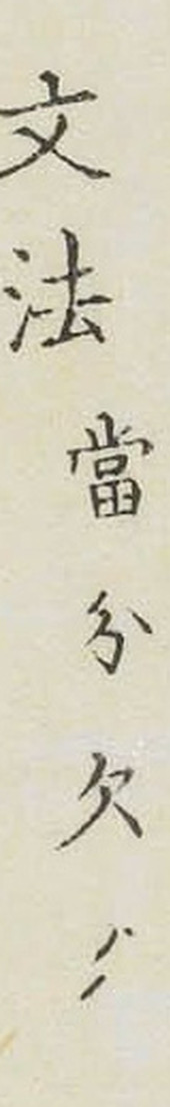文法当分欠ク
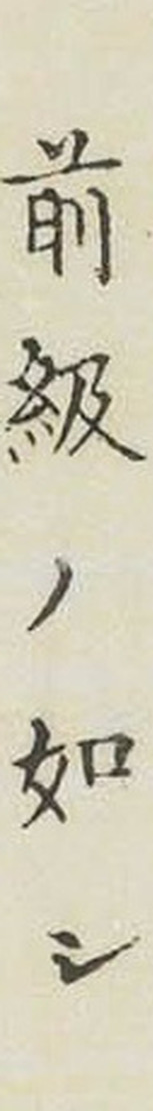前級ノ如シ
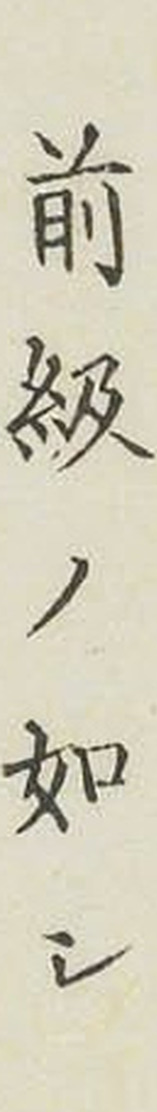前級ノ如シ
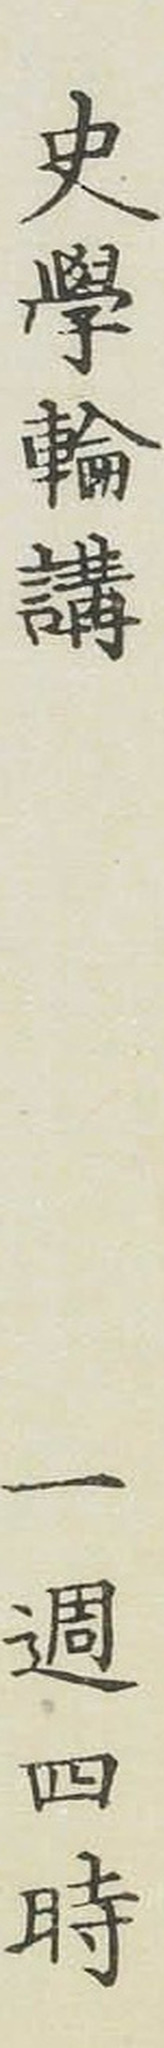史学輪講一週四時
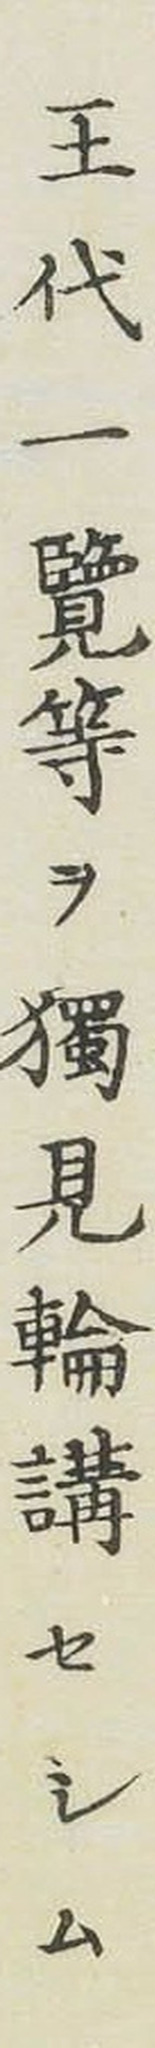王代一覧等ヲ独見輪講セシム
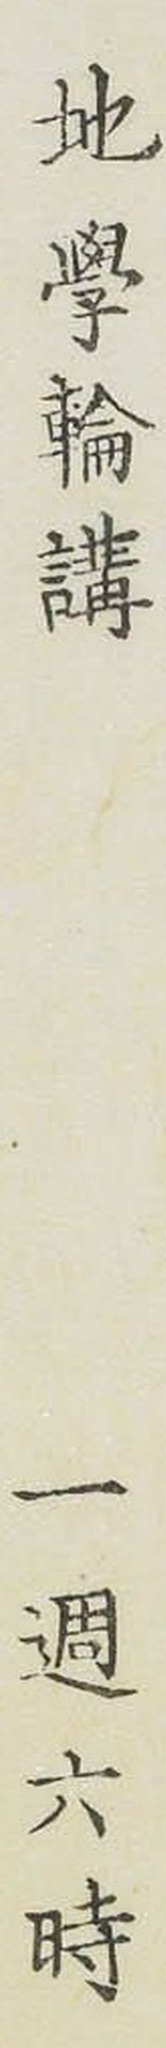地学輪講一週六時
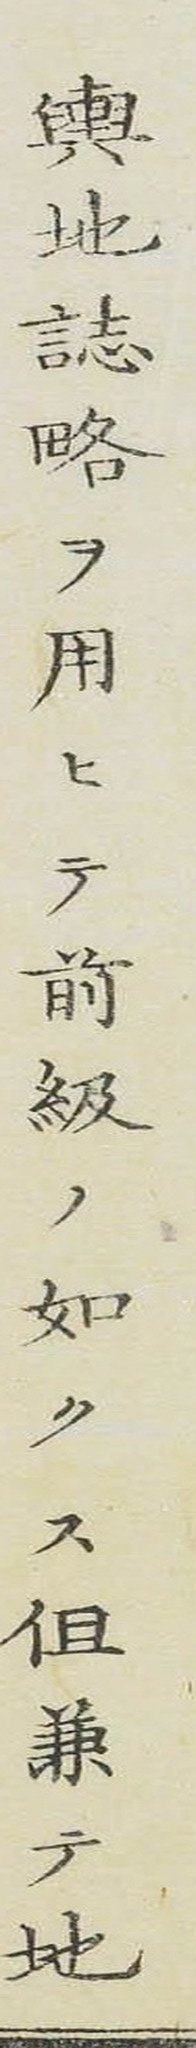輿地誌略ヲ用ヒテ前級ノ如クス但兼テ地
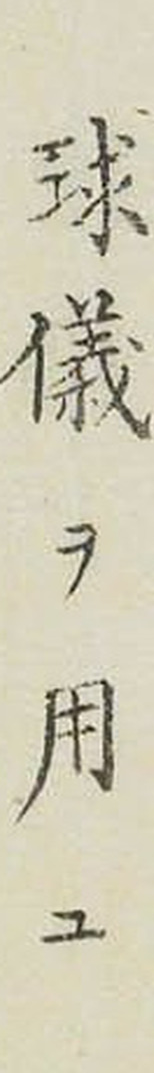球儀ヲ用ユ
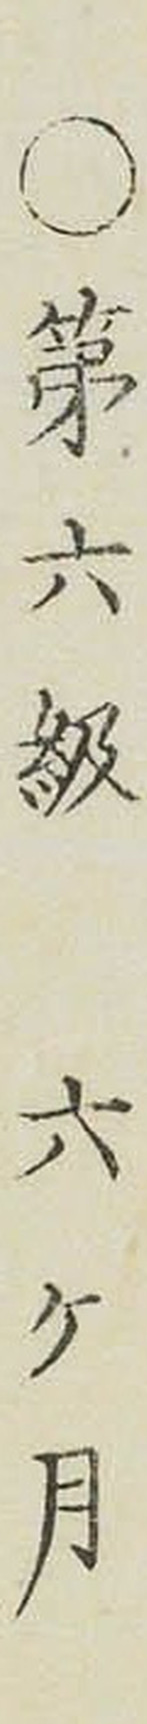○第六級六ケ月
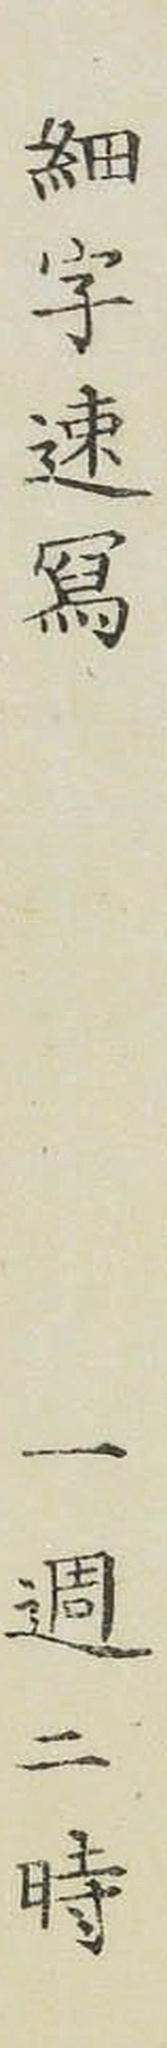細字速写一週二時
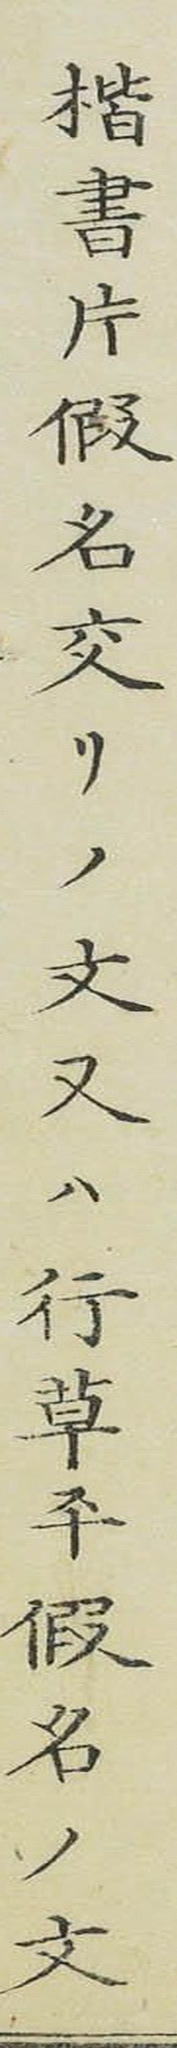楷書片仮名交リノ文又ハ行草平仮名ノ文

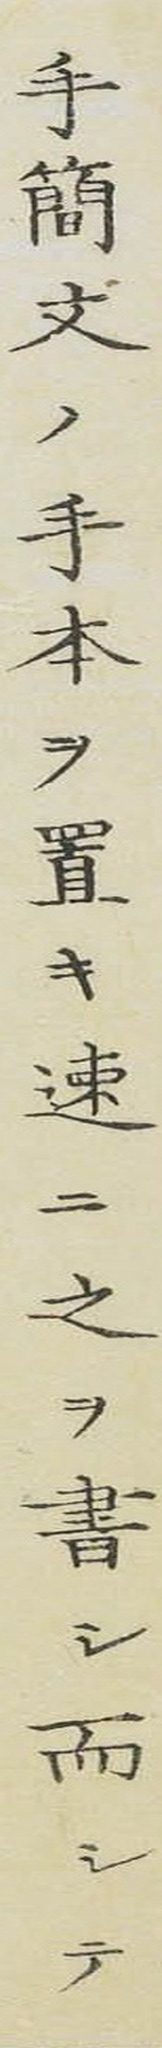手簡文ノ手本ヲ置キ速ニ之ヲ書シ而シテ
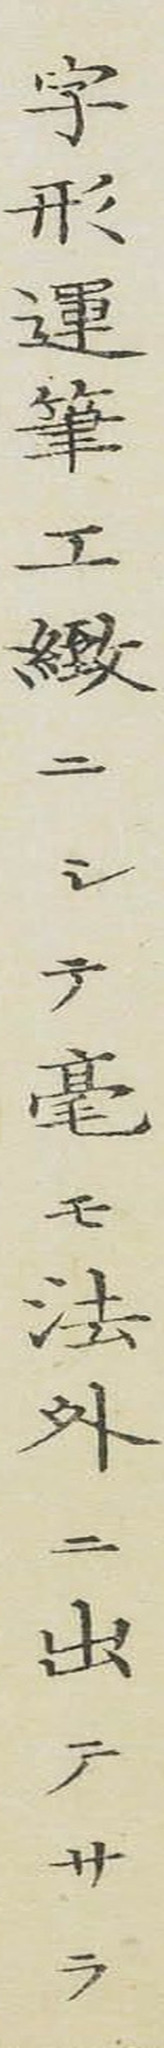字形運筆工緻ニシテ毫モ法外ニ出テサラ
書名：小学教則
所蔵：東京学芸大学教育コンテンツアーカイブ
